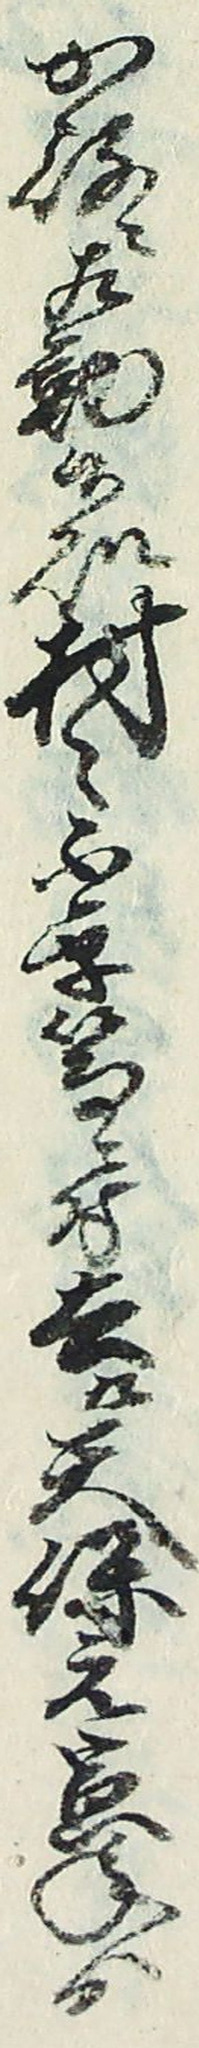出役に相勤候処村々不平等に付去る天保元寅年より
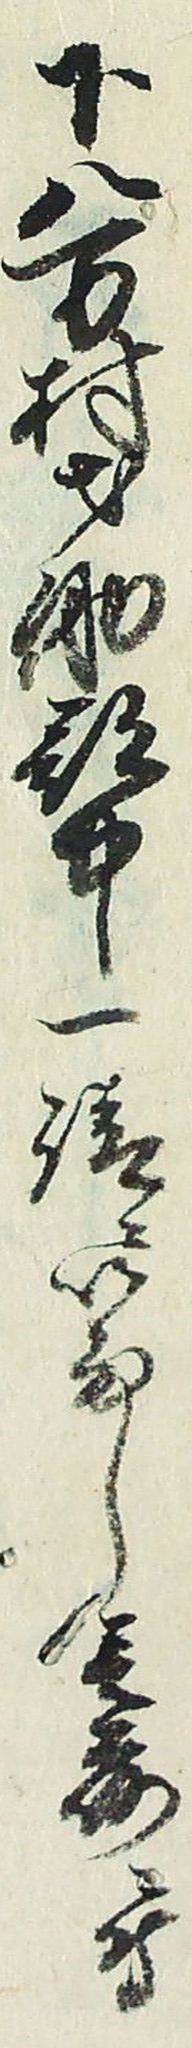下八万村才助郡中一請にいたし壱荷に付
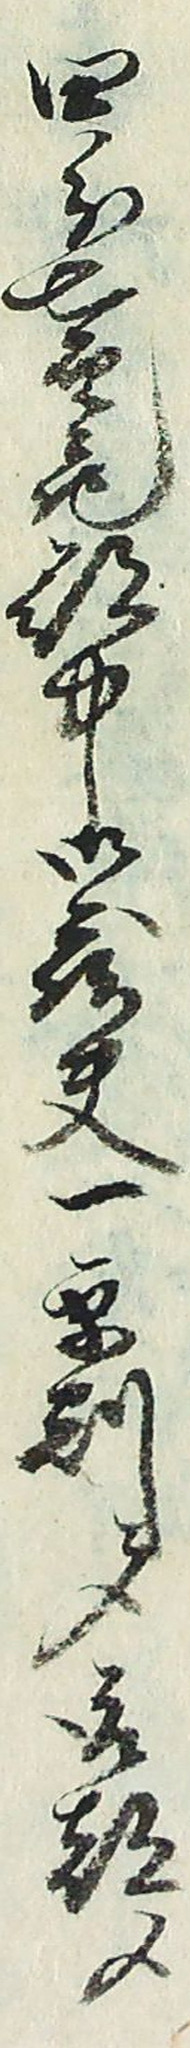四分七厘宛郡中御蔵夫一平割にして取都め
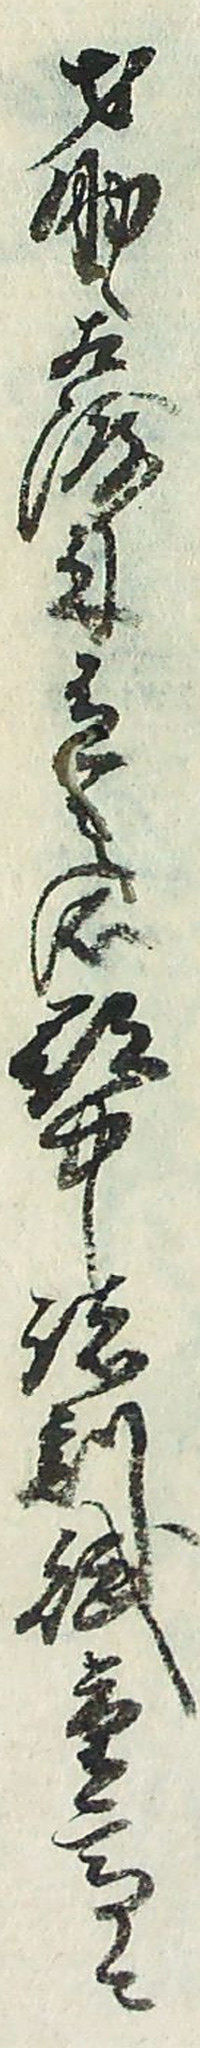才助へ相渡来有之所郡中諸割賦重高に
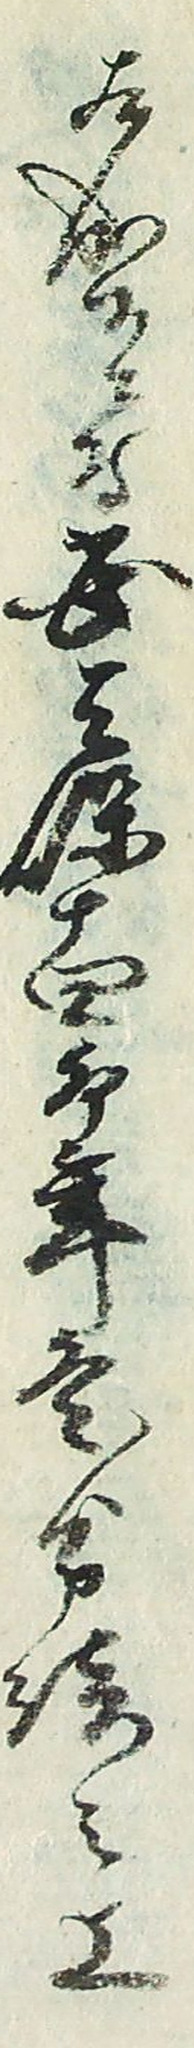相成候に付当天保十四卯年冬より申談の上
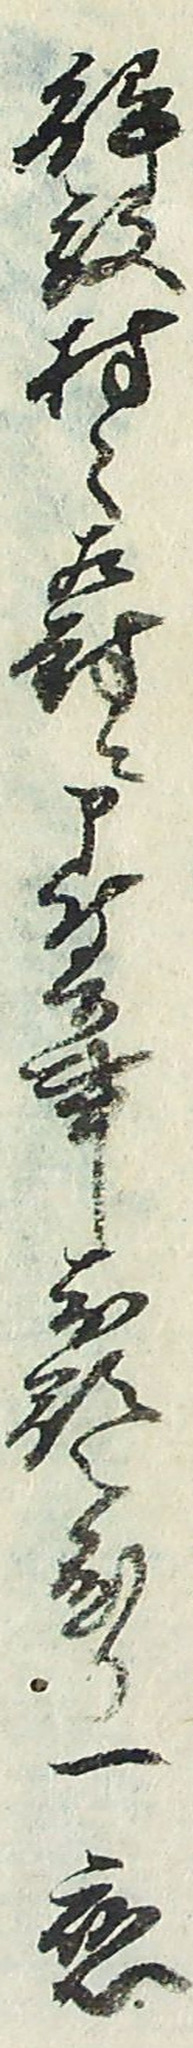解放村々相対に申付候事前顕の懸り一応
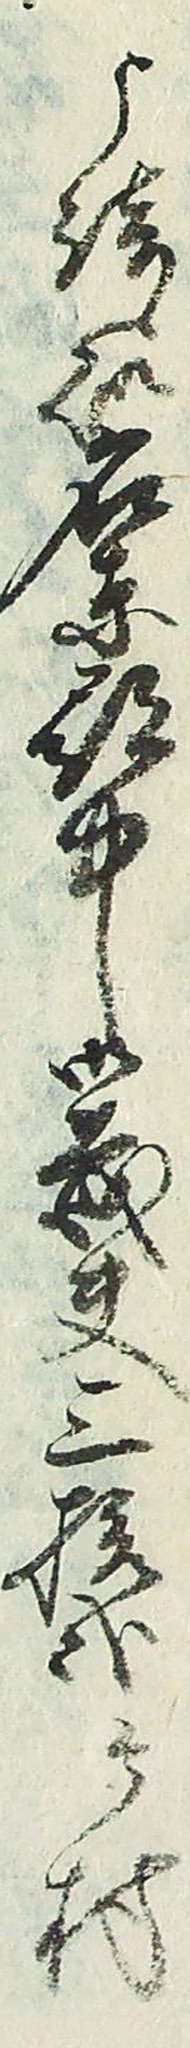申談候処名東郡中御蔵夫三十二ヶ村
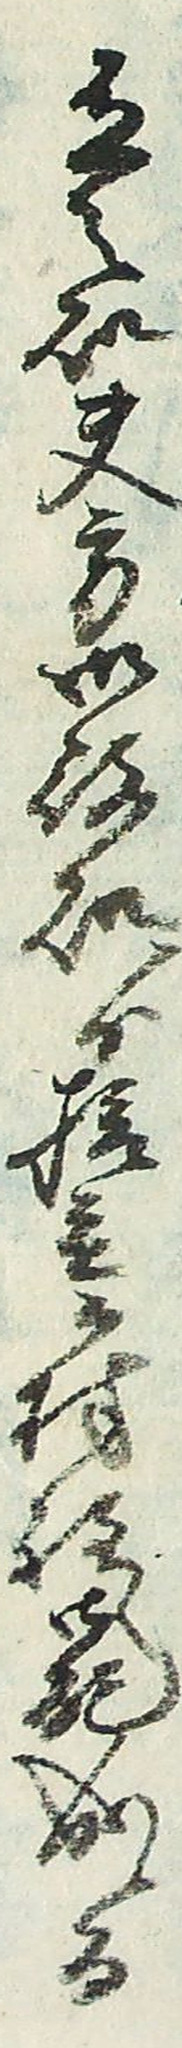有之候処夫方御役処より十一ヶ村程御配成候て
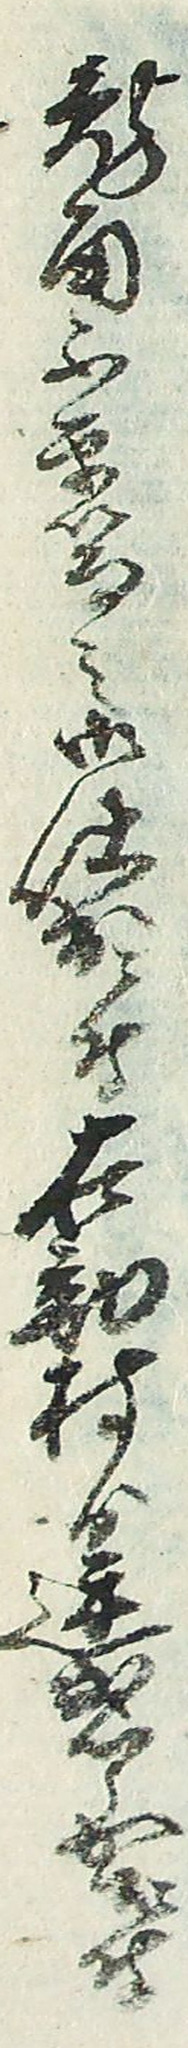兎角不平等の御仕出に付右勤村より迷惑申出候に付

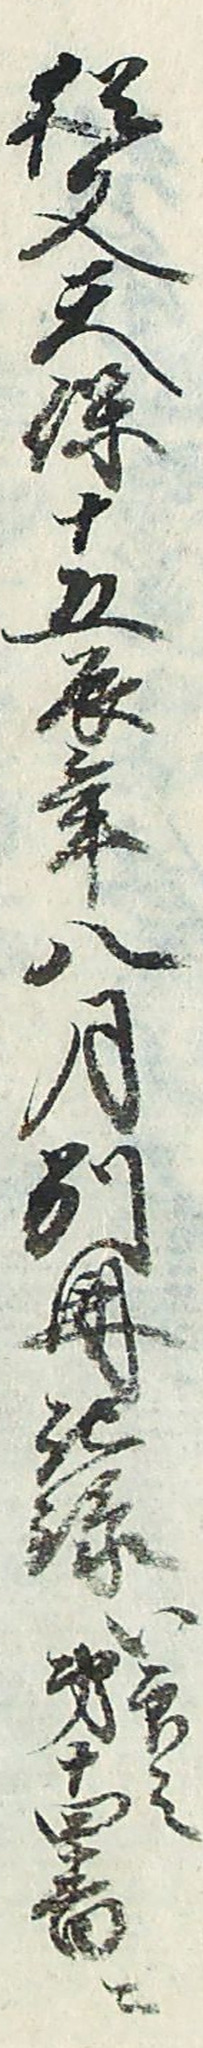猶又天保十五辰年八月別冊記録い印の第十四番に
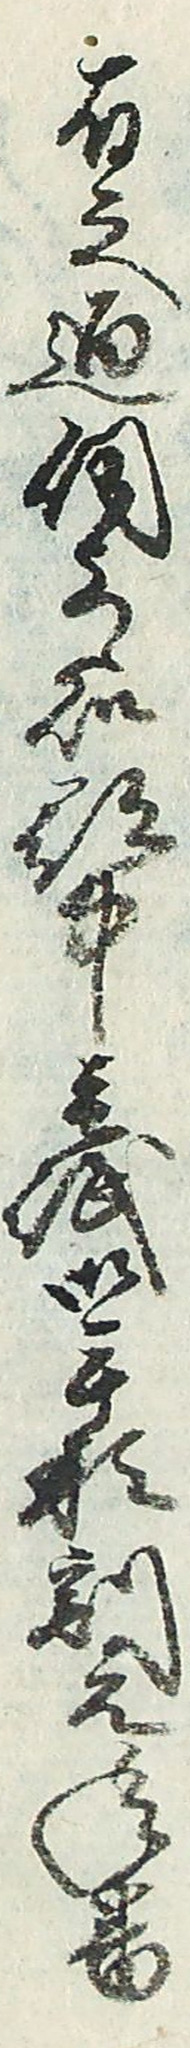有之通伺上候処郡中一紙御手形割元年番
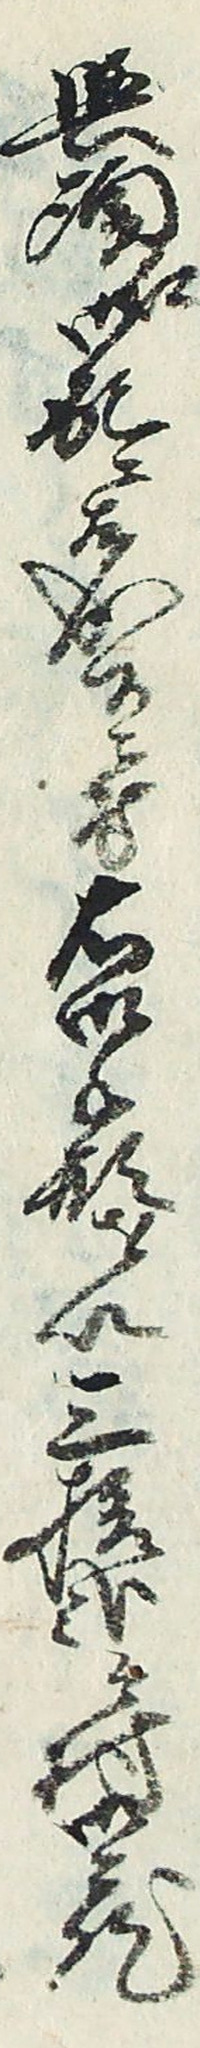与頭え御配に相成候に付右御手形を以三十二ヶ村御蔵
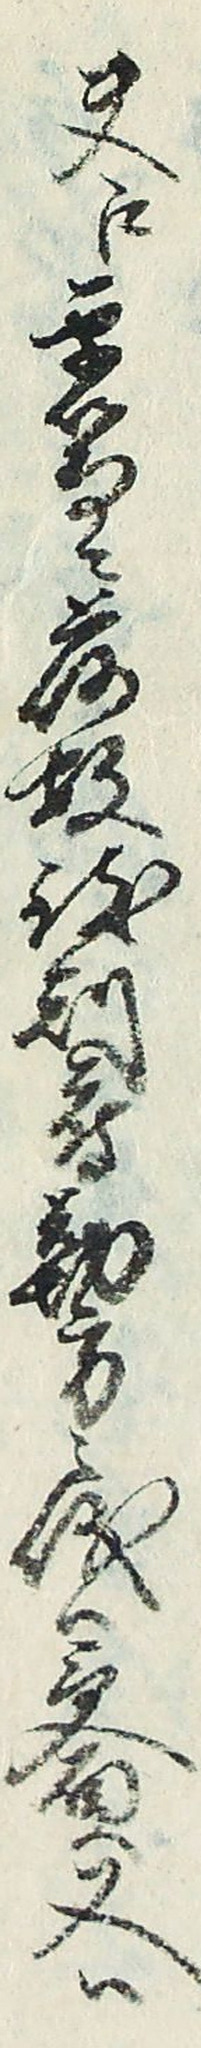夫え平等に荷数致割符勤方の儀は受負又は
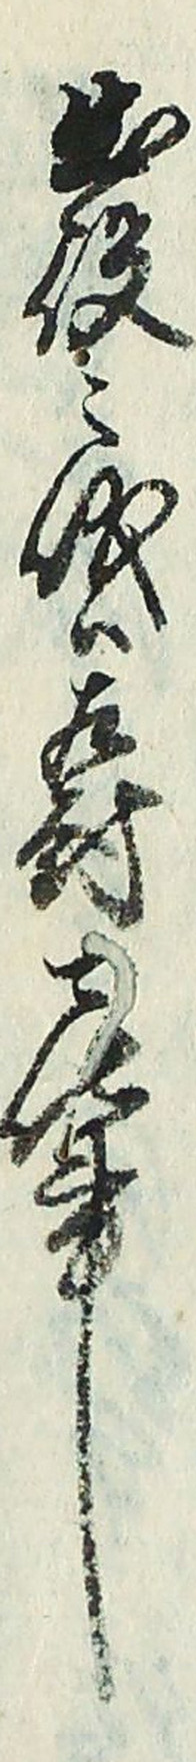出役の儀は相対可仕事
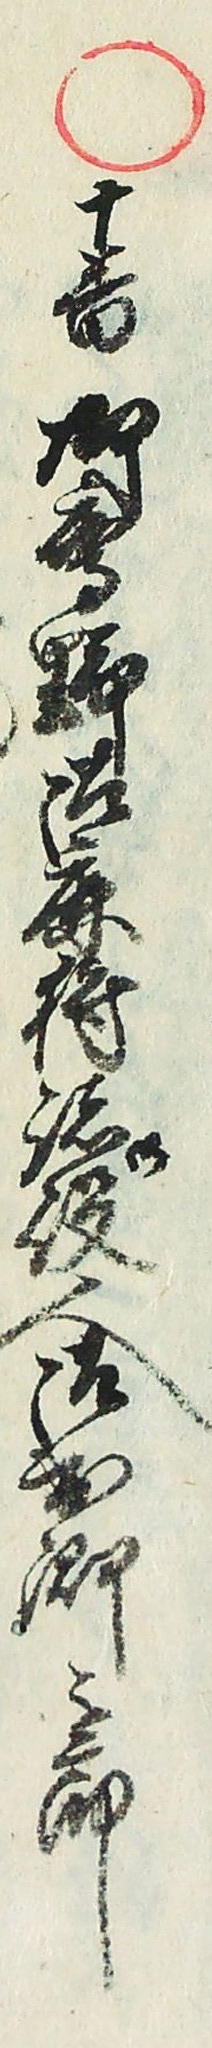十番御鷹野御鹿狩諸御役人御出郷之節
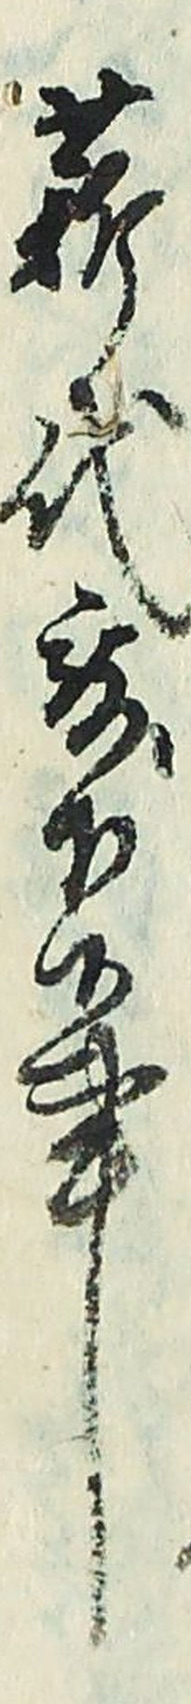薪代被下候事
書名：諸割賦物賃銀定記録帳
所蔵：鳴門教育大学 Naruto University of Education
